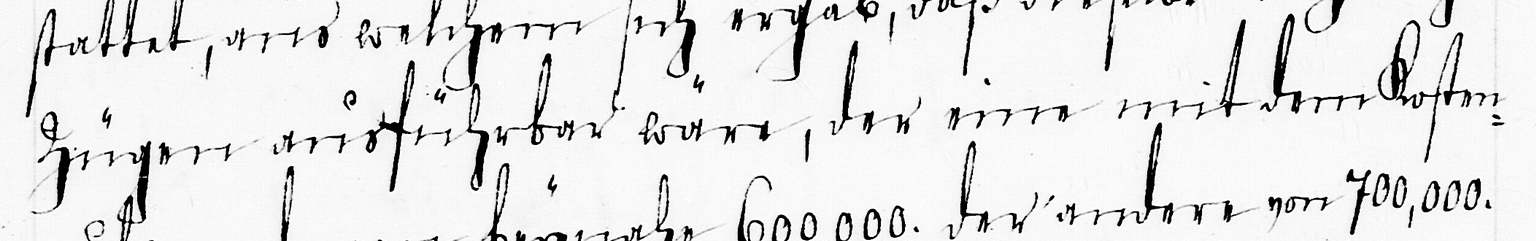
Zügen ausführbar wäre, der eine mit dem Kosten¬
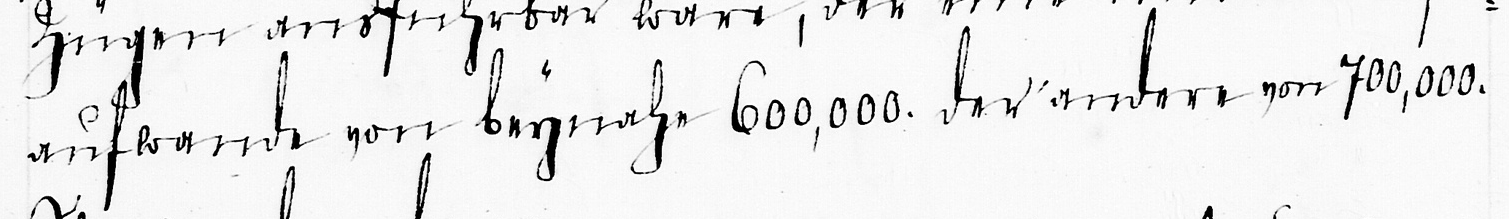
aufwande von beynahe 600,000. der andere von 700,000.
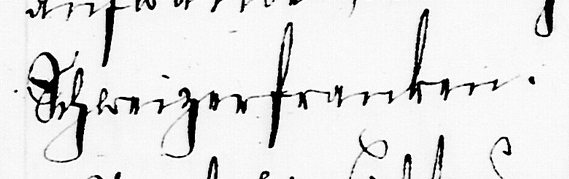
Schweizerfranken.
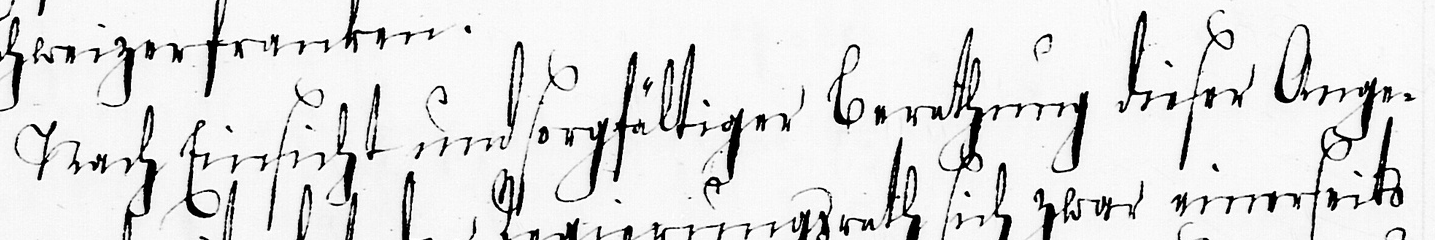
Nach Einsicht und sorfältiger Berathung dieser Ange¬
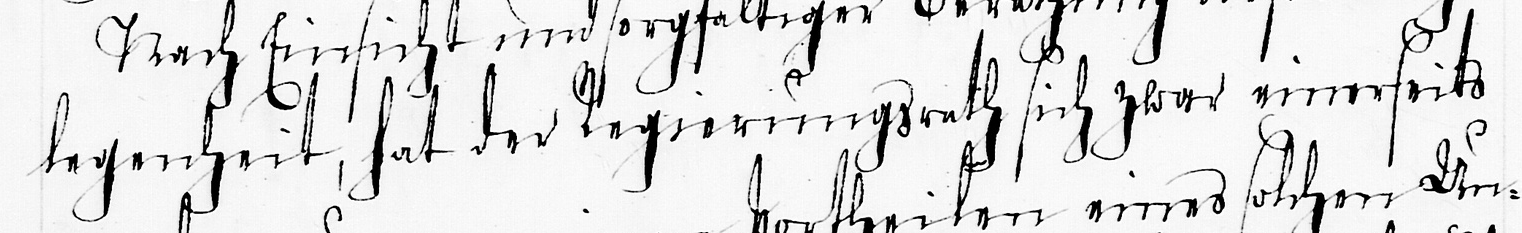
legenheit, hat der Regierungsrath sich zwar einerseits
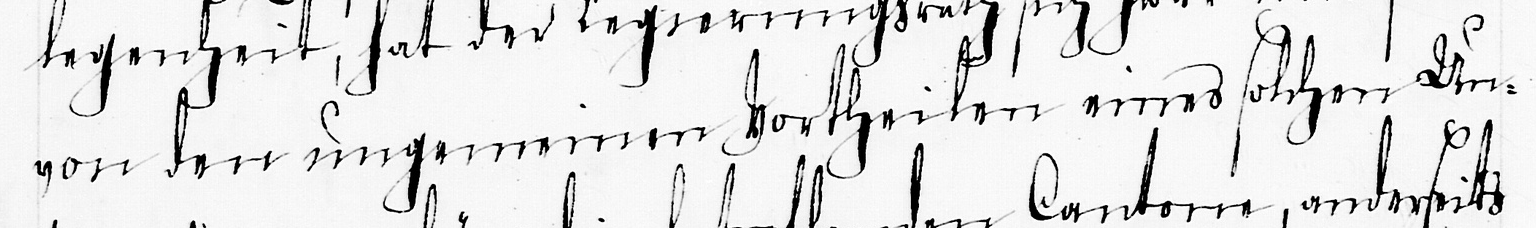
von den ungemeinen Vortheilen eines solchen Un¬
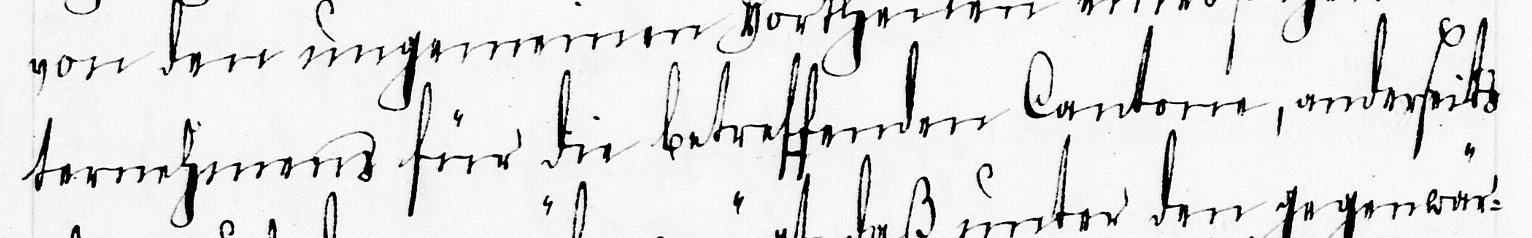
ternehmens für die betreffenden Cantone, anderseits
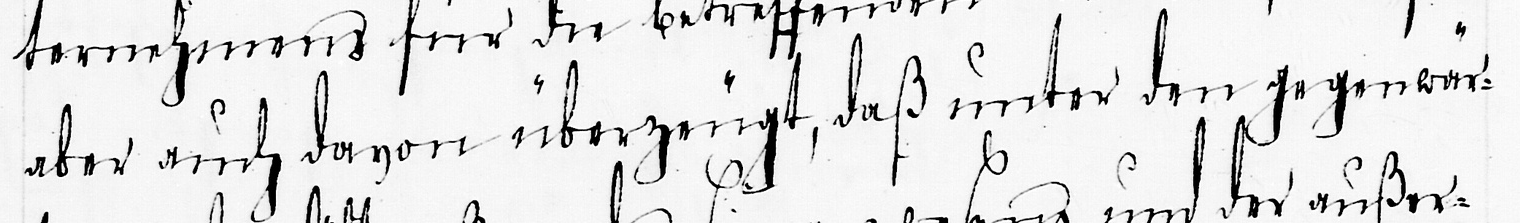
aber auch davon überzeugt, daß unter den gegenwär¬
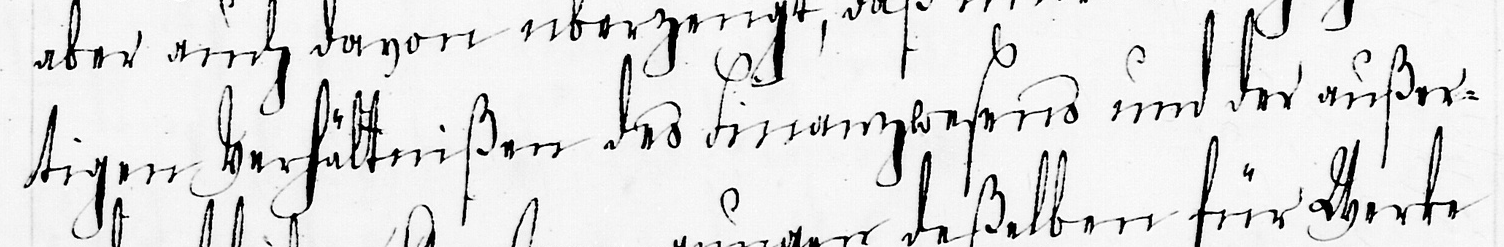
tigen Verhältnißen des Finanzwesens und der außer¬
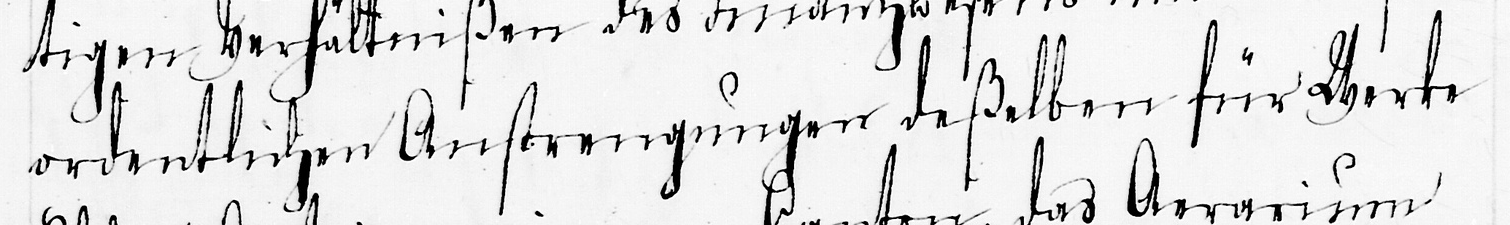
ordentlichen Anstrengungen deßelben für Werke
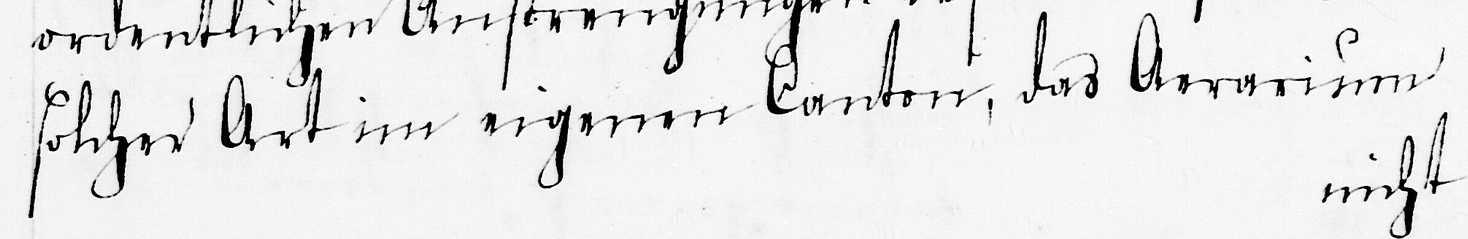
solcher Art im eigenen Canton, das Aerarium
